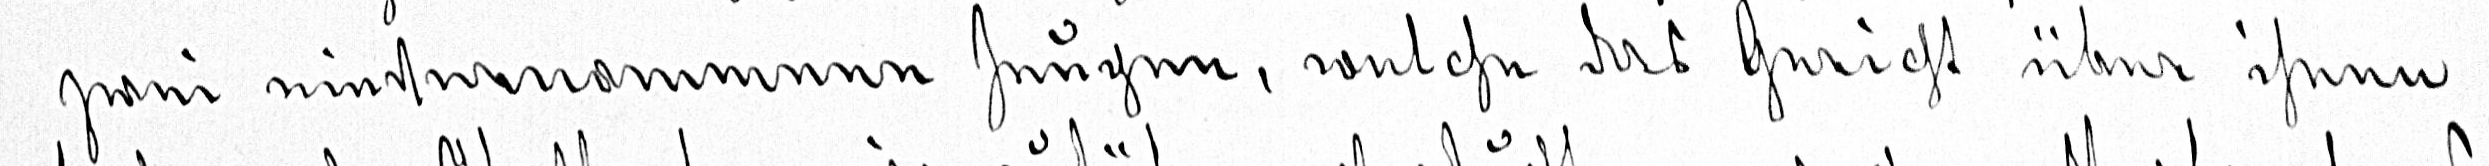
zwei einvernommene Zeugen, welche das Gericht über ihnen
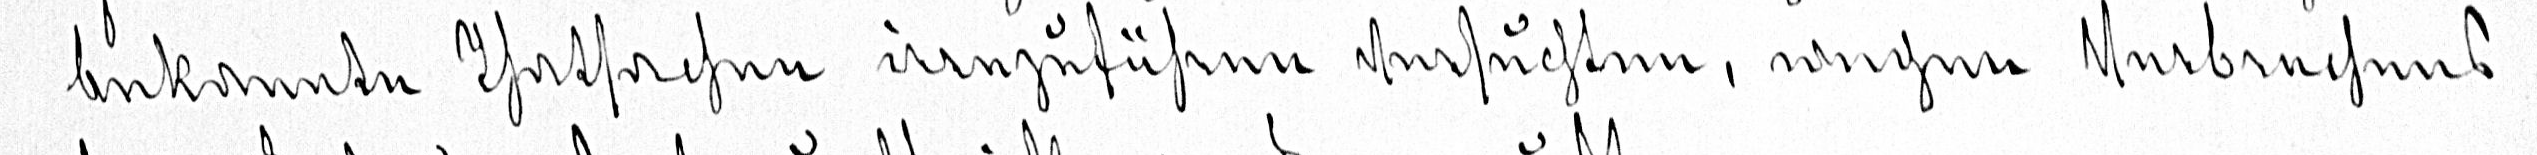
bekannte Thatsachen irrezuführen versuchten, wegen Verbrechens
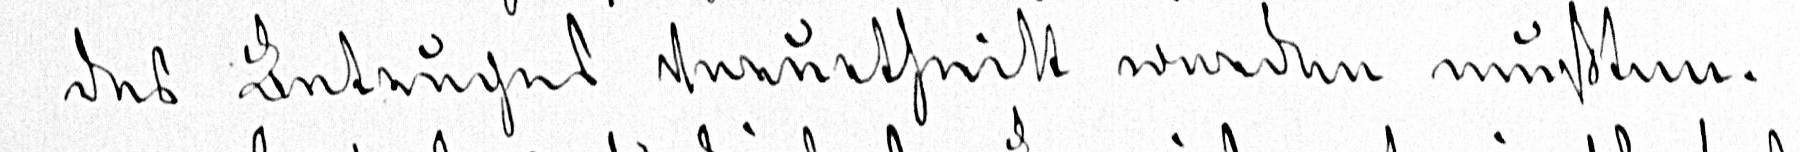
des Betruges verurtheilt werden mußten.
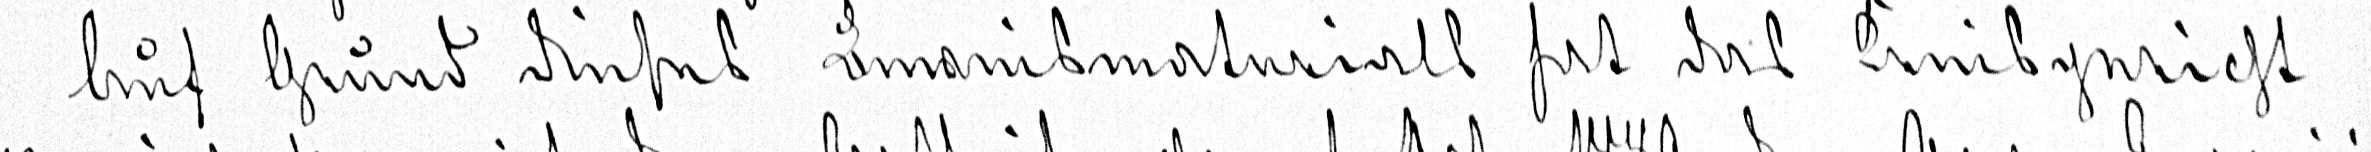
Auf Grund dieses Beweismaterials hat das Kreisgericht
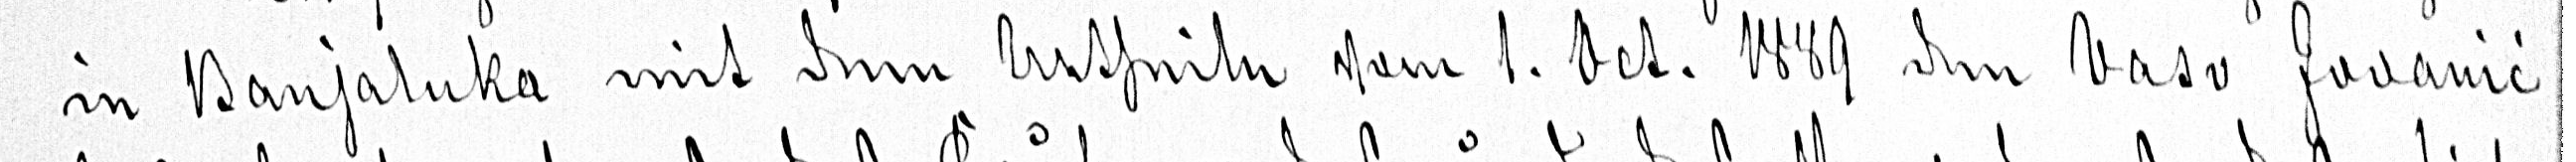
in Banjaluka mit dem Urtheile vom 1. Oct. 1889 den Vaso Jovanić
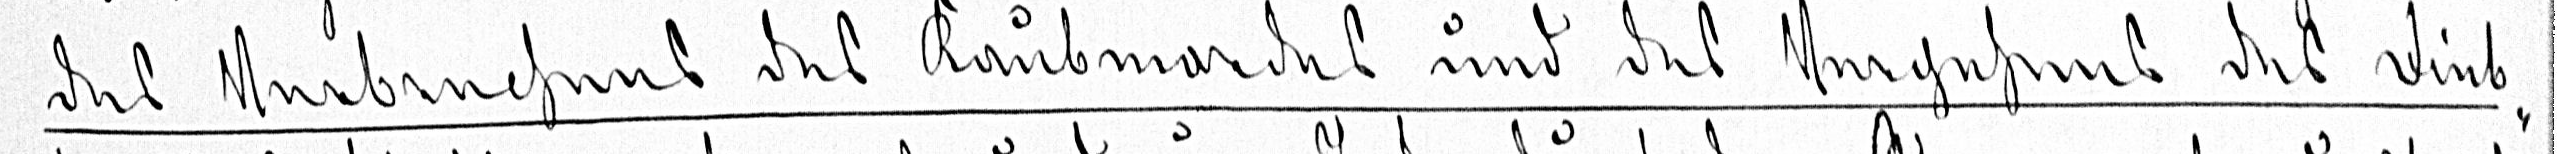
des Verbrechens des Raubmordes und des Vergehens des Dieb¬
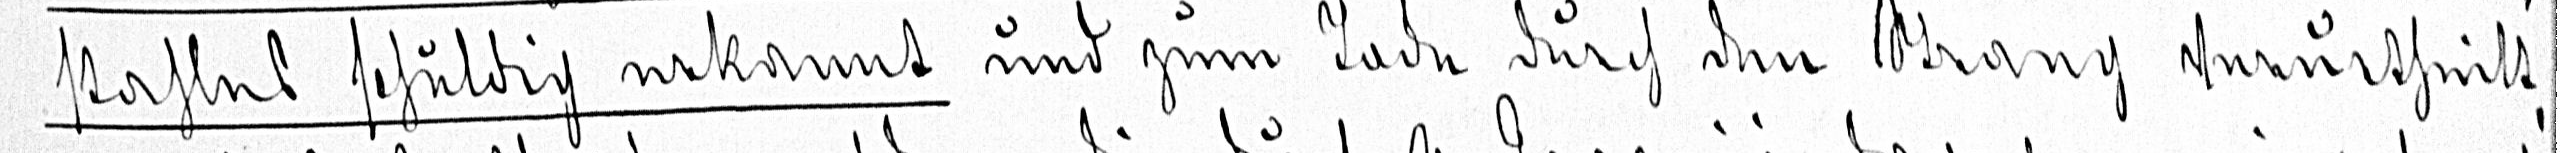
stahles schuldig erkannt und zum Tode durch den Strang verurtheilt,
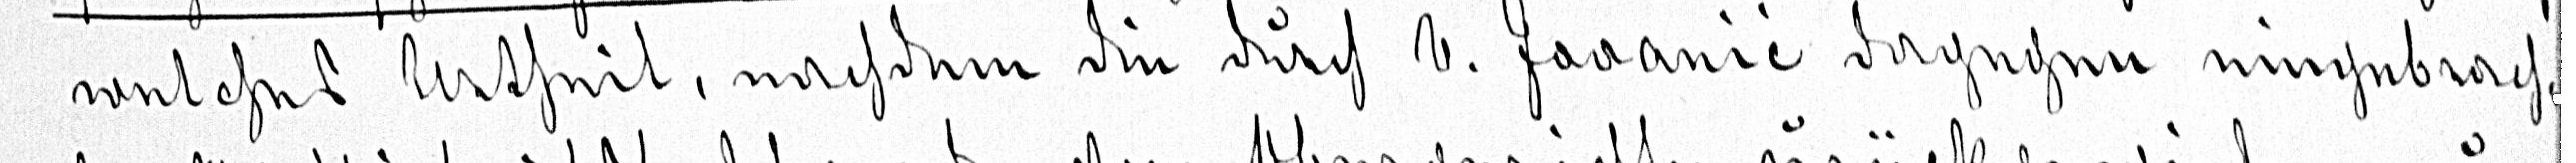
welches Urtheil, nachdem die durch vV. Jovanić dagegen eingebrach¬
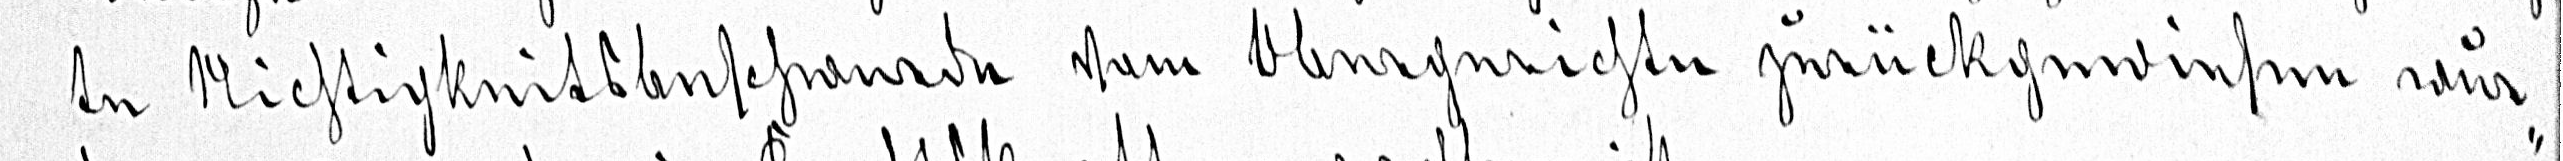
te Nichtigkeitsbeschwerde vom Obergerichte zurückgewiesen wur¬
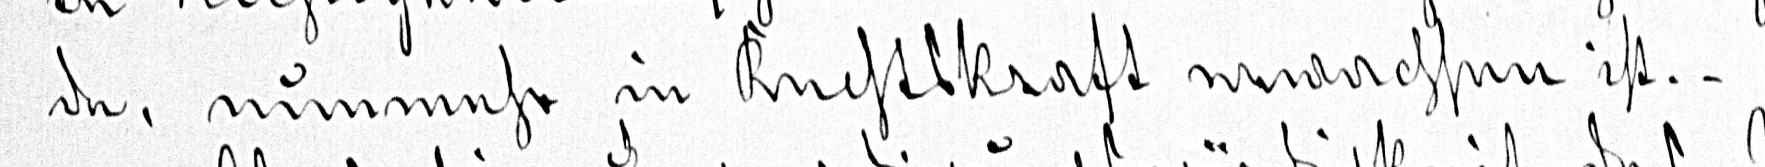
de, nunmehr in Rechtskraft erwachsen ist.-
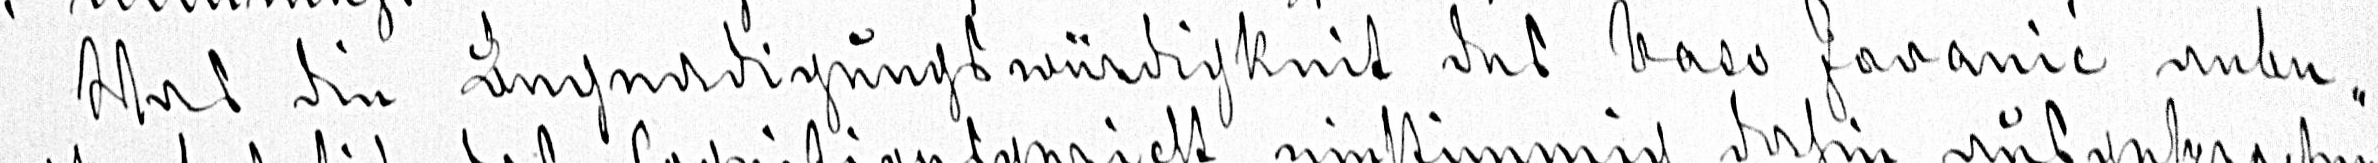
Was die Begnadigungswürdigkeit des Vaso Jovanić anbe¬
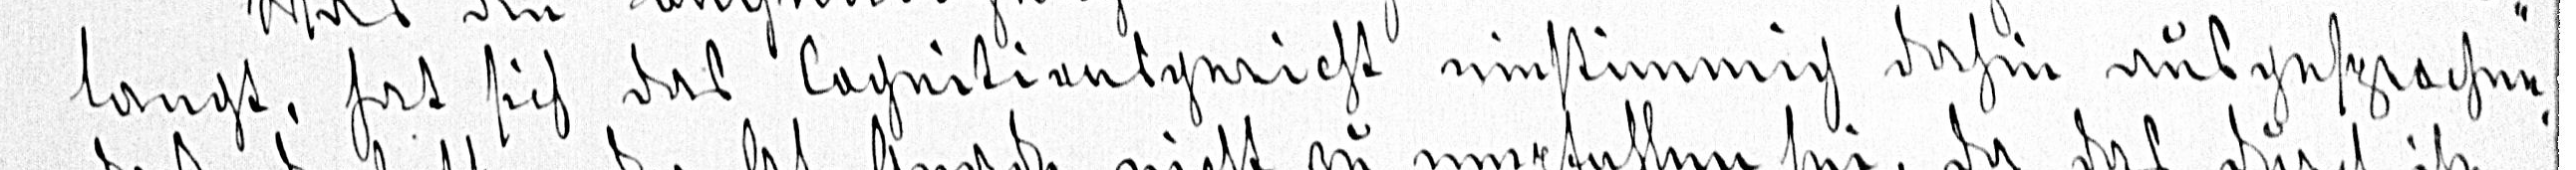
langt, hat sich das Cognitionsgericht einstimmig dahin ausgesprochen,
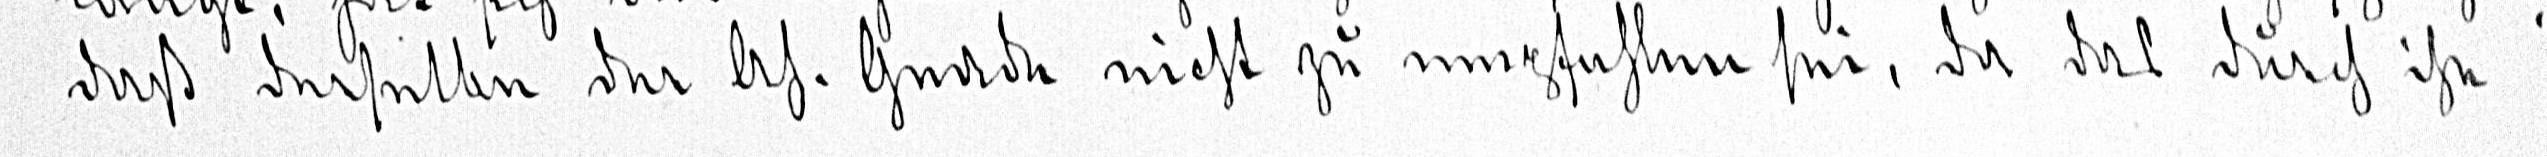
daß derselbe der Ah. Gnade nicht zu empfehlen sei, da das durch ihn
